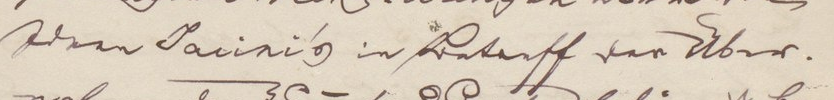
Ideen Jacini's in Betreff der Über-
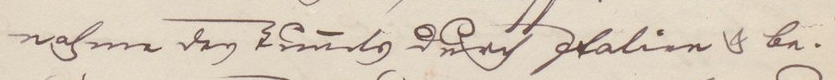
nahme des Tunnels durch Italien & be-
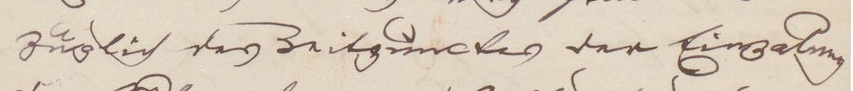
züglich des Zeitpunctes der Einzalung
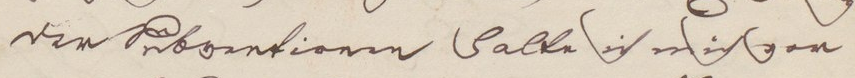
der Subventionen halte ich mich vor
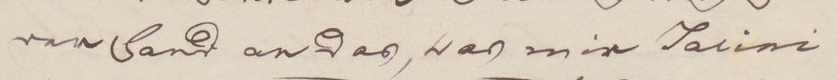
der Hand an das, was mir Jacini
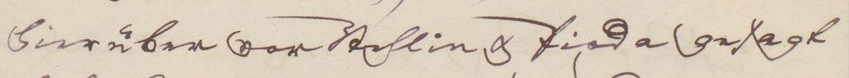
hierüber vor Stehlin & Pioda gesagt
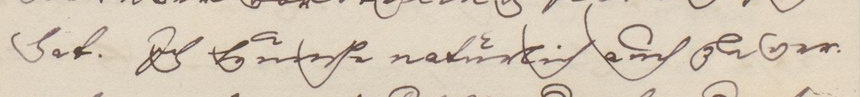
hat. Ich wünsche natürlich auch zu ver-
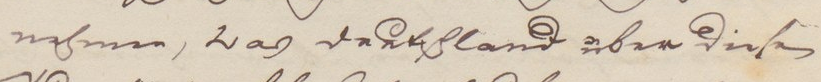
nehmen, was Deutschland über diese
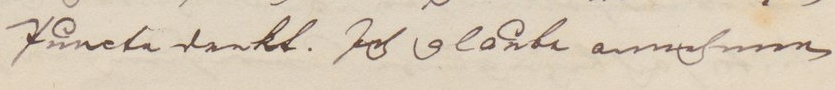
Puncte denkt. Ich glaube annehmen
